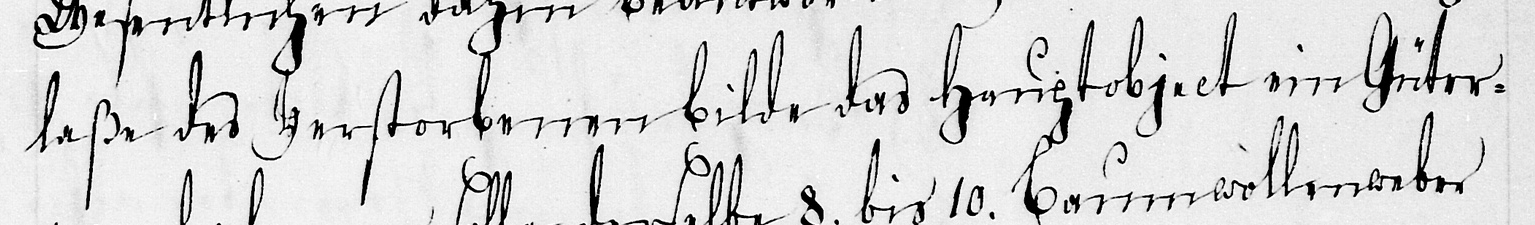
laße des Verstorbenen bilde das Hauptobject ein Güter¬
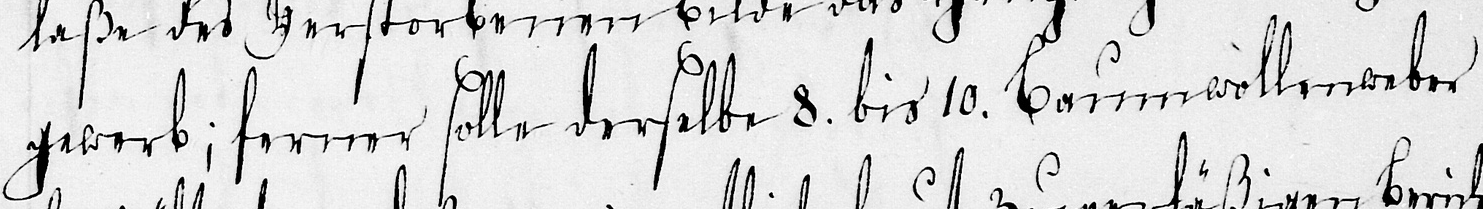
gewerb; ferner solle derselbe 8. bis 10. Baumwollenweber
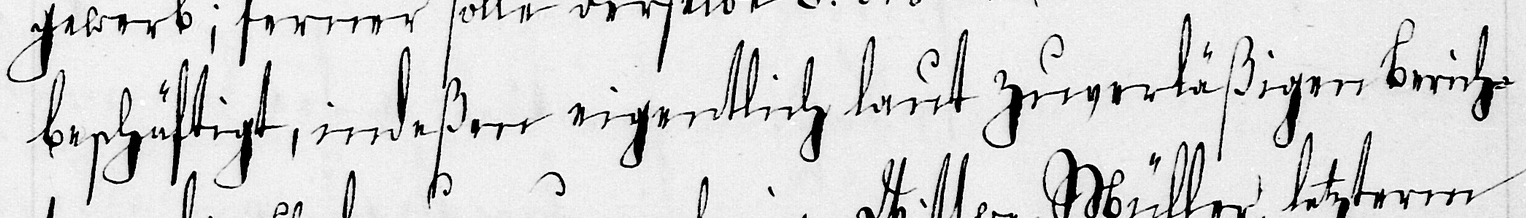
beschäftigt, indeßen eigentlich laut zuverläßigen Berich¬
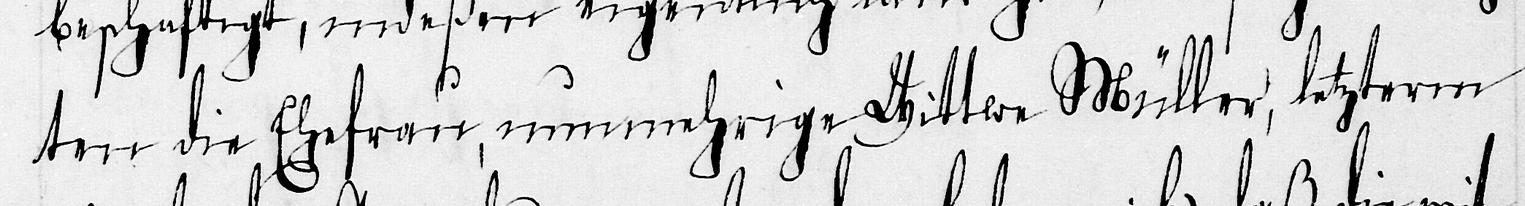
ten die Ehefrau, nunmehrige Wittwe Müller, letzterm
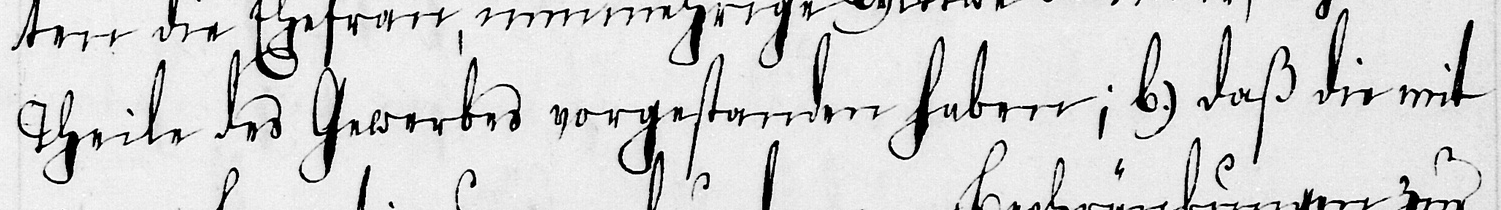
Theile des Gewerbes vorgestanden haben; b.) daß die mit
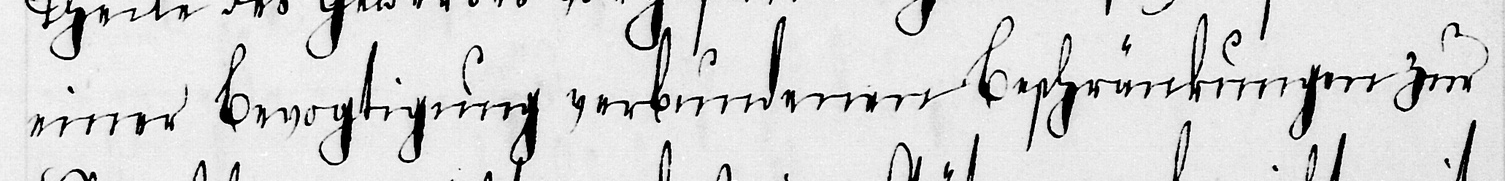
einer Bevogtigung verbundenen Beschränkungen zur
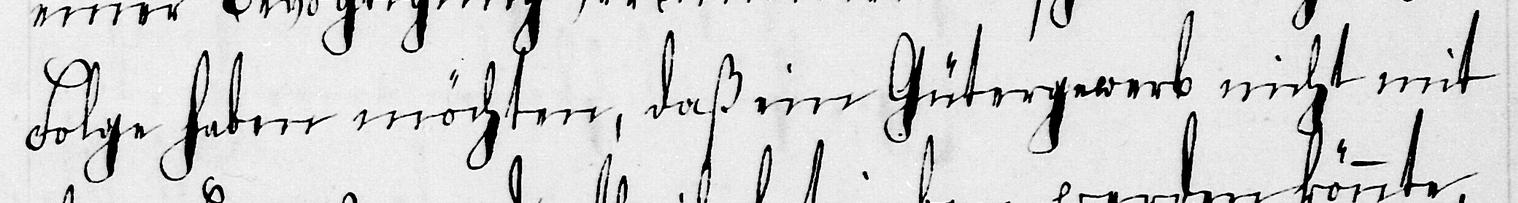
Folge haben möchten, daß ein Gütergewerb nicht mit
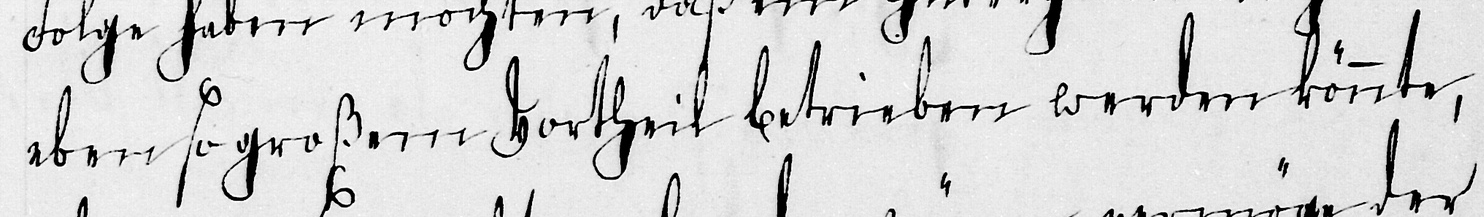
ebenso großem Vortheil betrieben werden könnte,
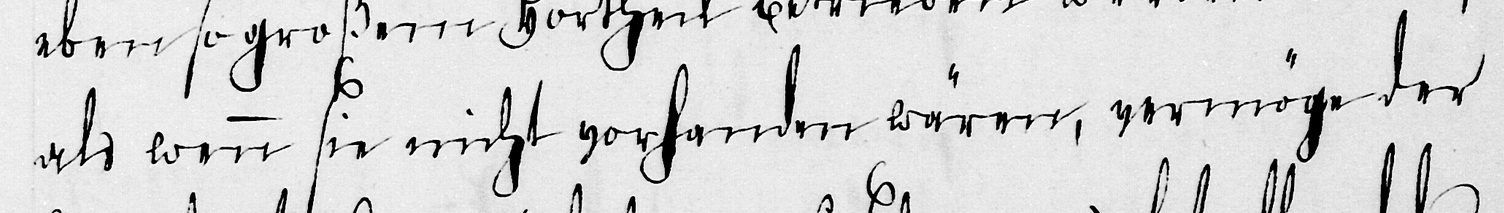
als wenn sie nicht vorhanden wären, vermöge der
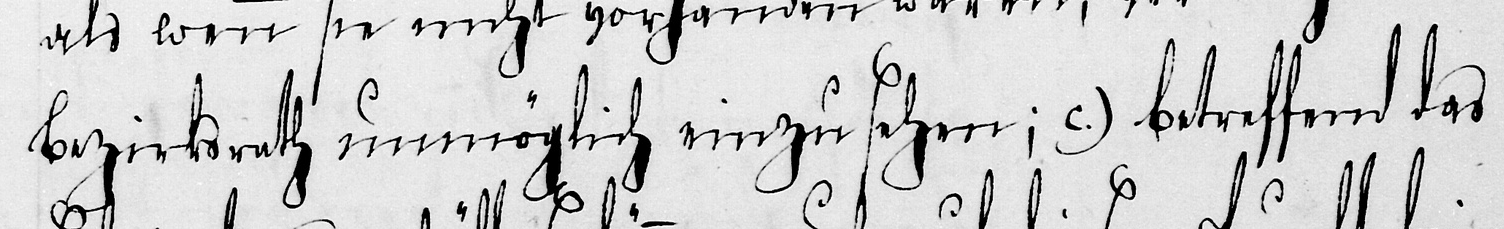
Bezirksrath unmöglich einzusehen; c.) betreffend das
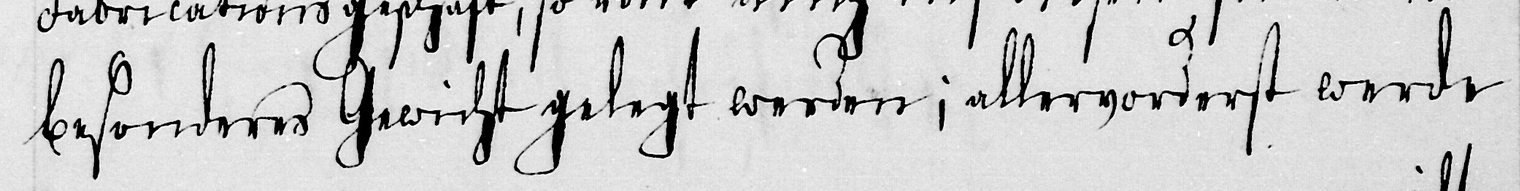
besonderes Gewicht gelegt werden; allervorderst werde
